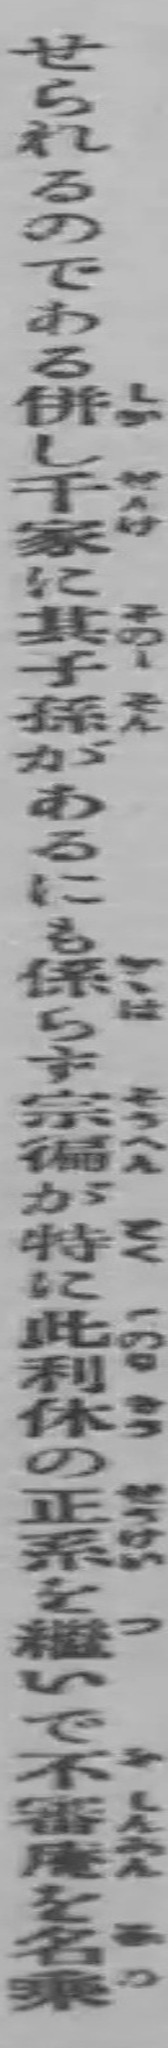せられるのである併し千家に其子孫があるにも係らず宗徧が特に此利休の正系を継いで不審庵を名乗
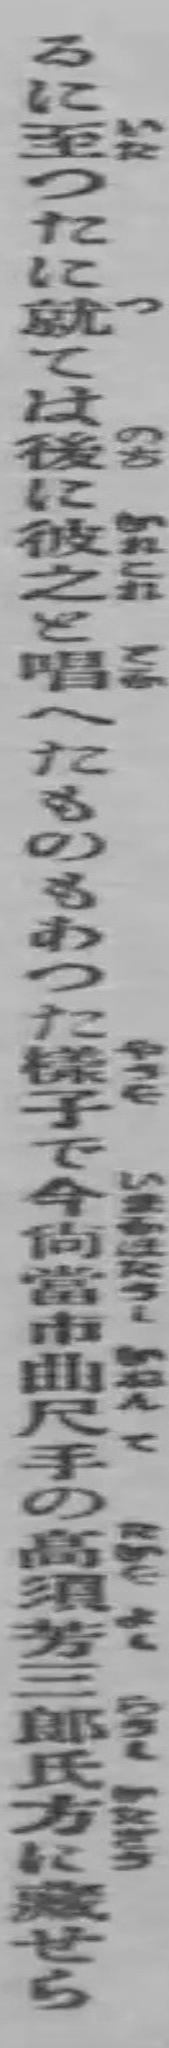るに至つたに就ては後に彼之と唱へたものもあつた様子で今尚当市曲尺手の高須芳三郎氏方に蔵せら
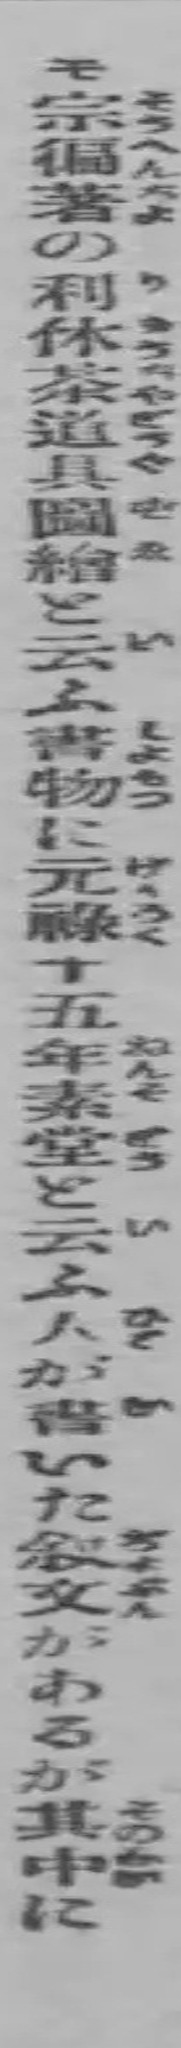モ宗徧著の利休茶道具図絵と云ふ書物に元禄十五年素堂と云ふ人が書いた叙文があるが其中に
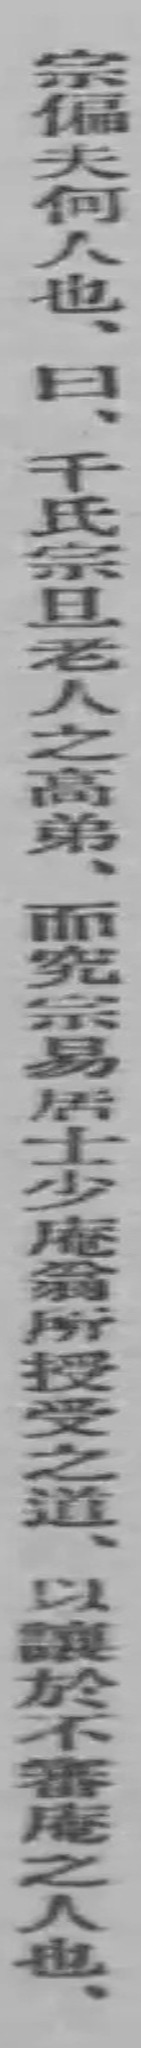宗偏夫何人也、曰、千氏宗旦老人之高弟、而究宗易居士少庵翁所授受之道、以譲於不審庵之人也、
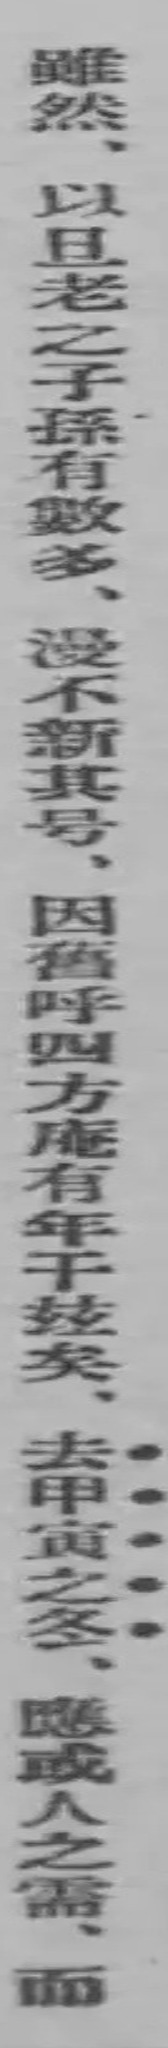雖然、以旦老之子孫有数多、漫不新其号、因旧呼四方庵有年干茲矣、去甲寅之冬、応或人之需、而
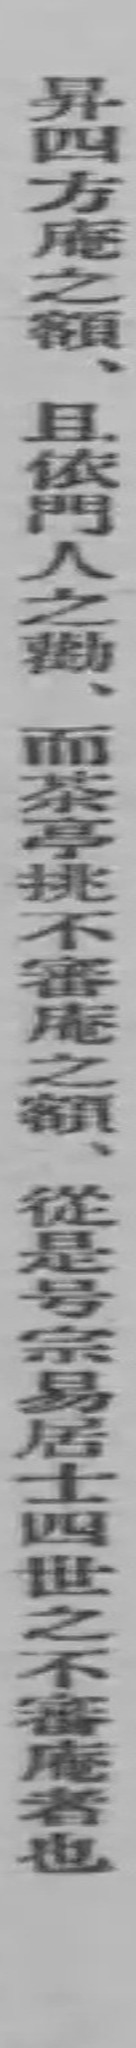昇四方庵之額、且依門人之勧、而茶亭挑不審庵之額、従是号宗易居士四世之不審庵者也
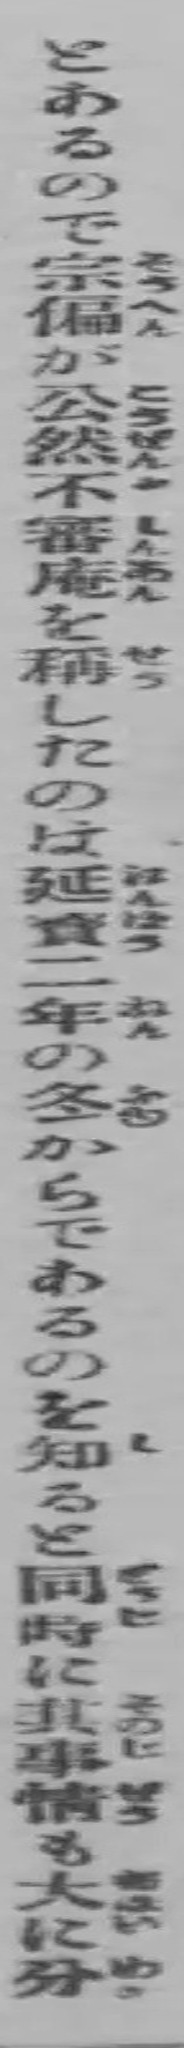とあるので宗偏が公然不審庵を称したのは延宝二年の冬からであるのを知ると同時に其事情も大に分
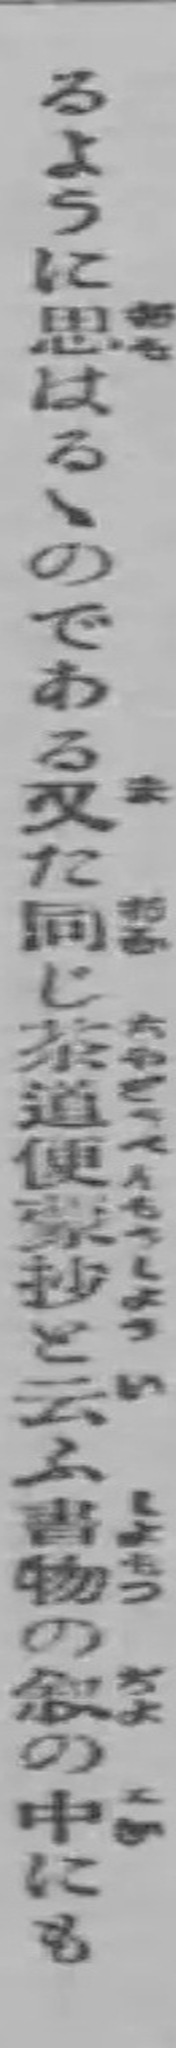茶道便蒙抄るように思はるゝのである又た同じ茶道便蒙抄と云ふ書物の叙の中にも
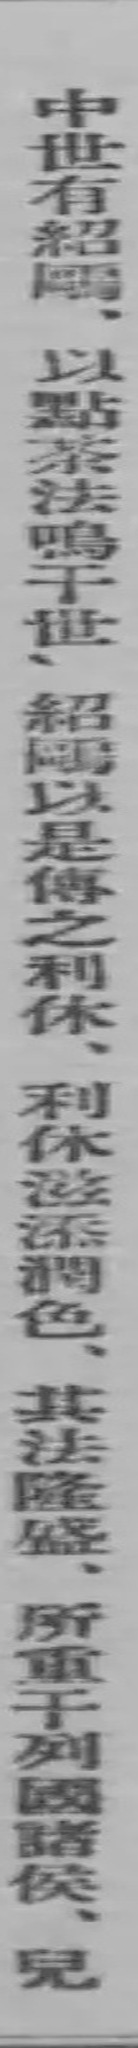中世有紹鷗、以点茶法鳴干世、紹鷗以是伝之利休、利休滋添潤色、其法隆盛、所重干列国諸侯、児
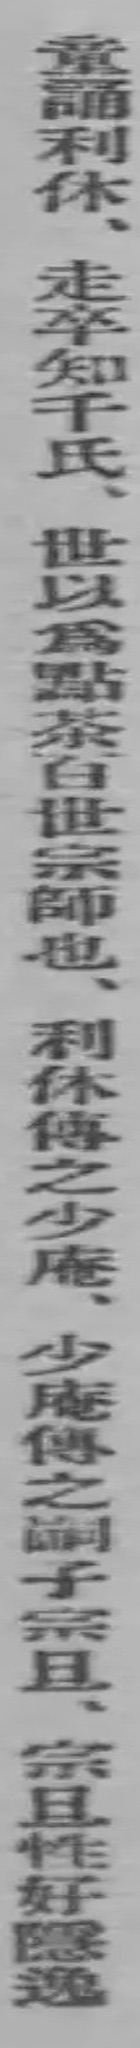童踊利休、走卒知千氏、世以為点茶百世宗師也、利休伝之少庵、少庵伝之嗣子宗旦、宗旦性好隠逸

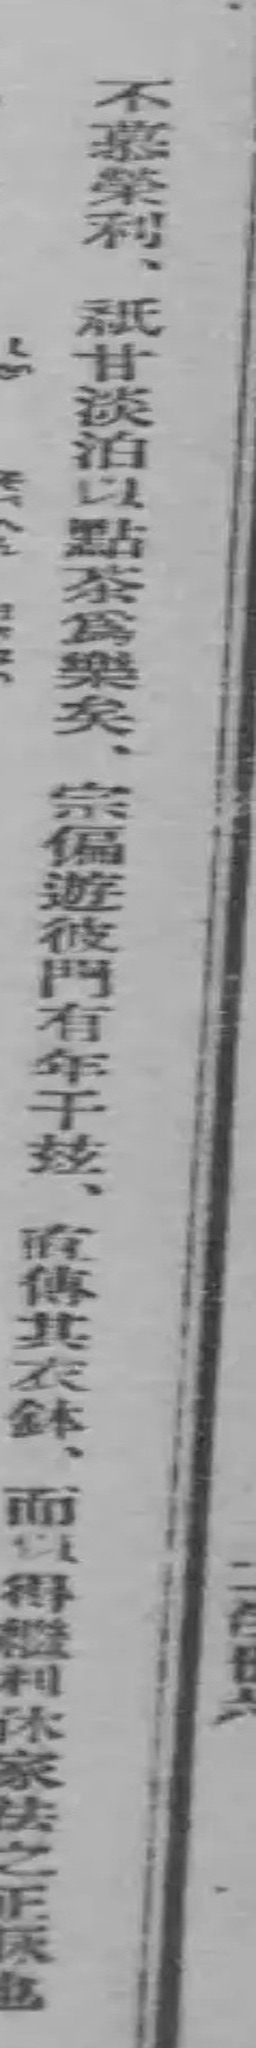不慕栄利、祇甘淡泊以点茶為楽矣、宗偏遊彼門有年干茲、直伝其衣鉢、而以得継利休家法之正脉也
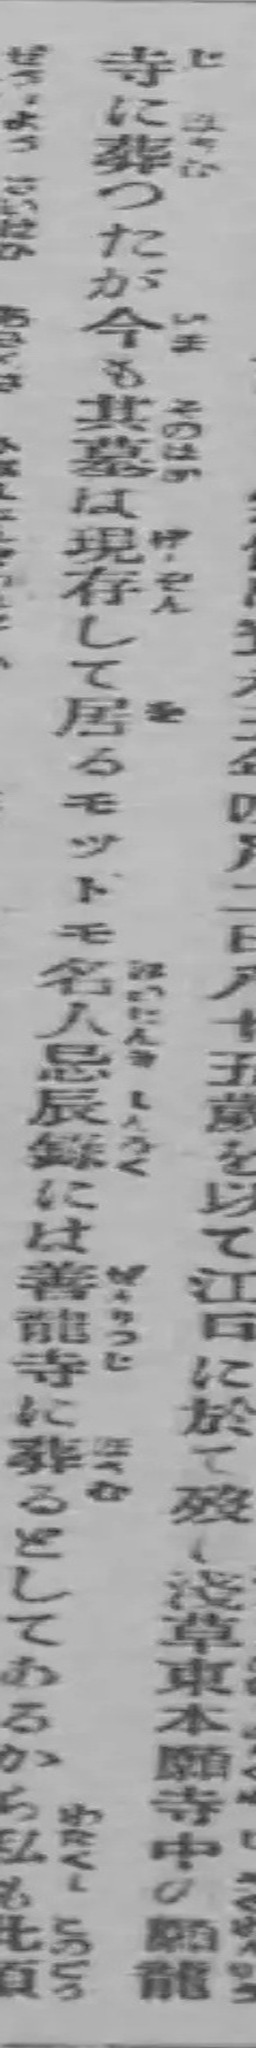寺に葬つたが今も其墓は現存して居るモツトモ名人忌辰録には善龍寺に葬るとしてあるから私も此頃
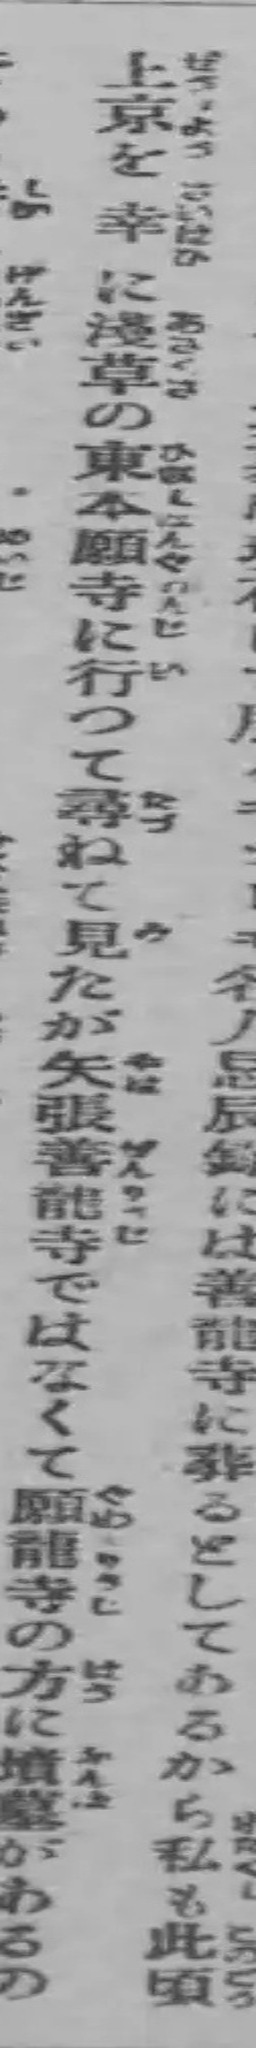上京を幸に浅草の東本願寺に行つて尋ねて見たが矢張善龍寺ではなくて願龍寺の方に墳墓があるの
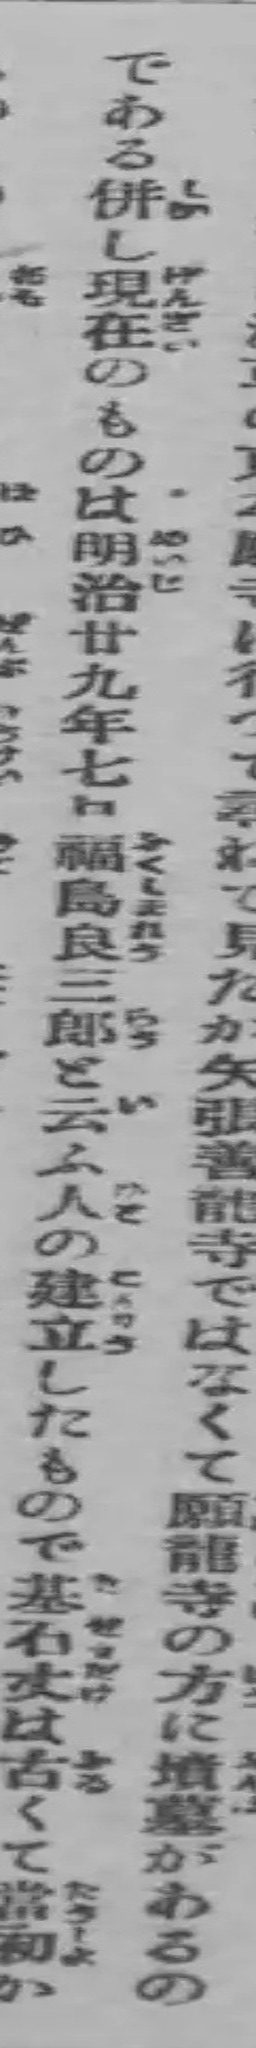である併し現在のものは明治廿九年七月福島良三郎と云ふ人の建立したもので基石丈は古くて当初か
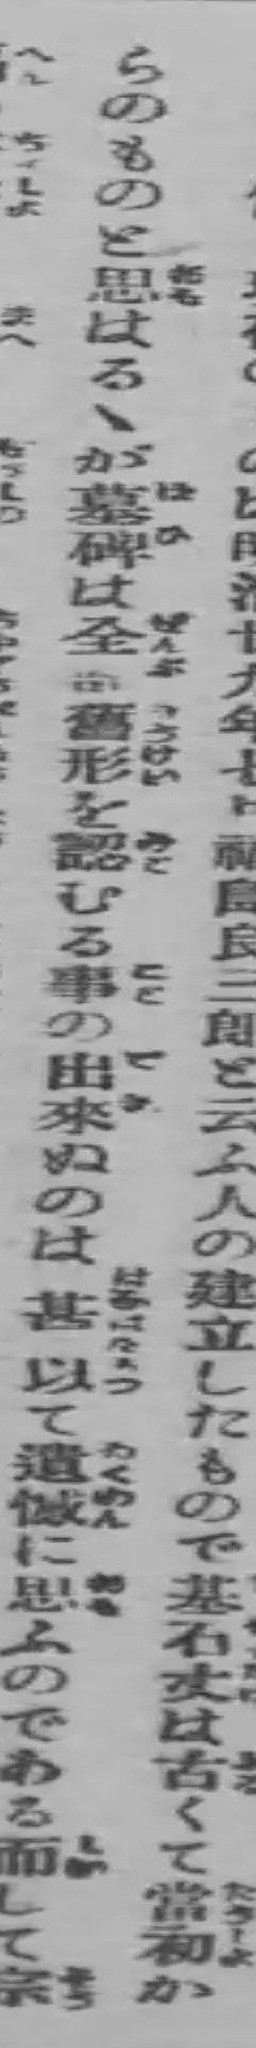らのものと思はるゝが墓碑は全部旧形を認むる事の出来ぬのは甚以て遺憾に思ふのである而して宗
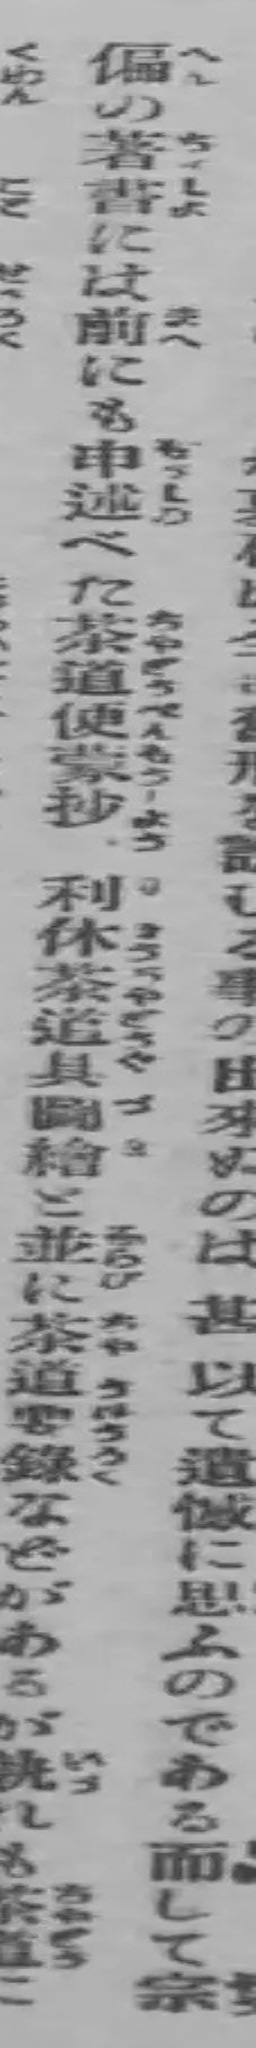茶道要録偏の著書には前にも申述べた茶道便蒙抄、利休茶道具図絵と並に茶道要録などがあるが孰れも茶道に
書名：豊橋市史談
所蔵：国立国会図書館 National Diet Library, JAPAN
